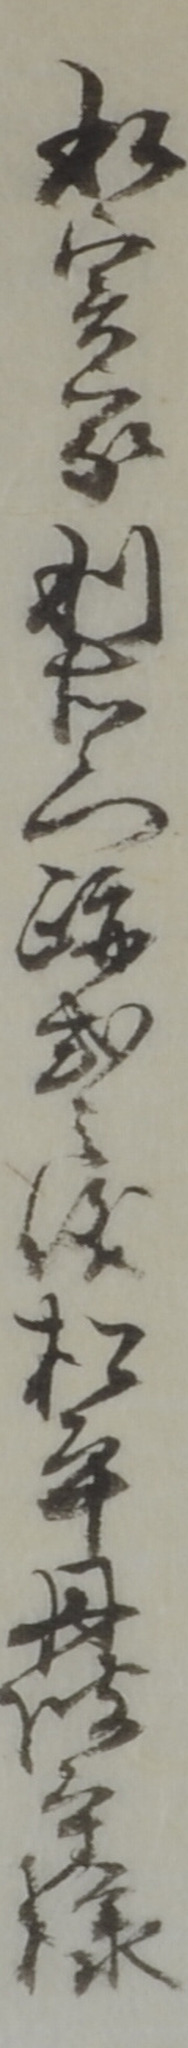私実家利右衛門跡式之儀松平丹波守様
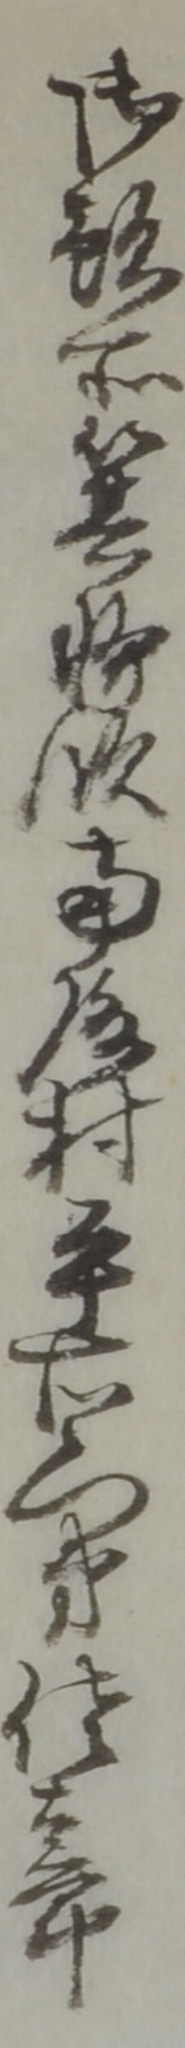御預所箕輪領南殿村平右衛門弟佐太郎
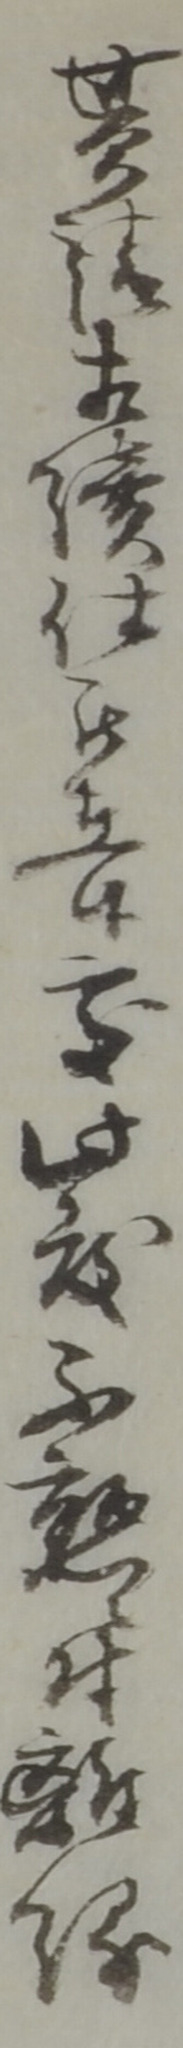貰請相続仕罷在候処此度不ニ付離縁
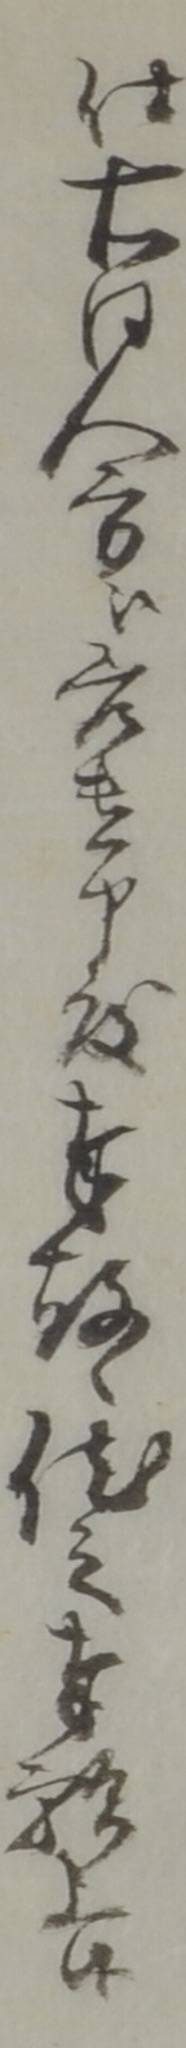仕右同人方江差遣申度奉存候依之奉願上候
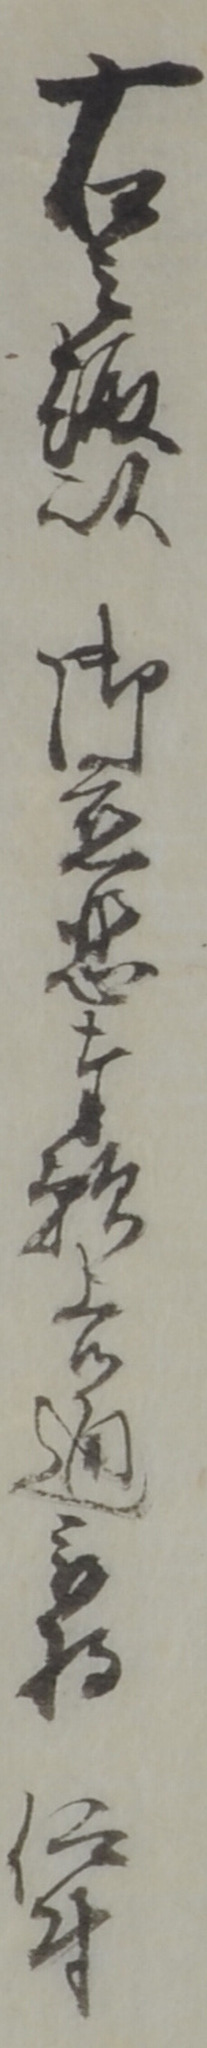右之趣以御慈悲奉願上候通被為仰付
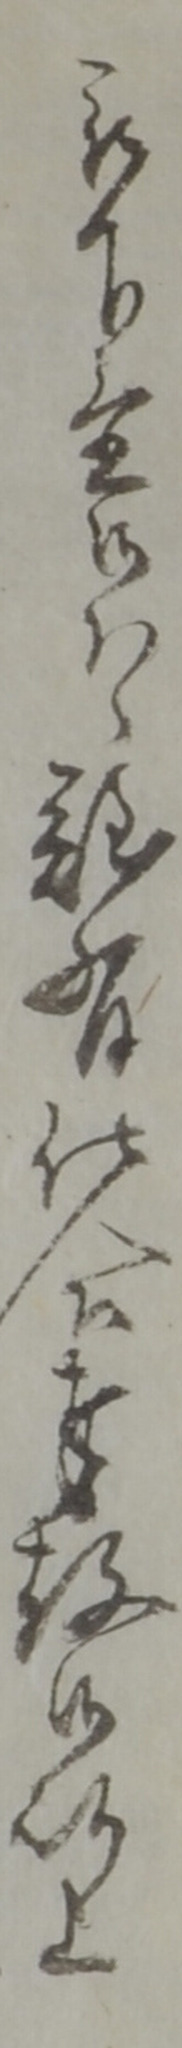被下置候ハヽ難有仕合奉存候以上
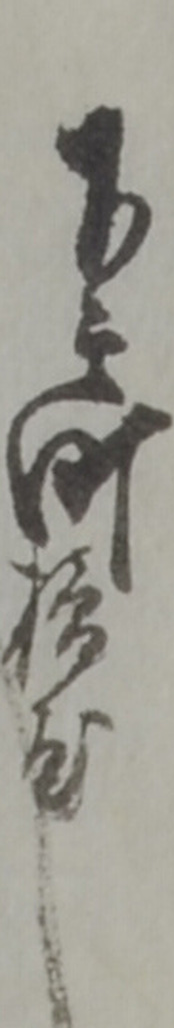下モ町椿屋
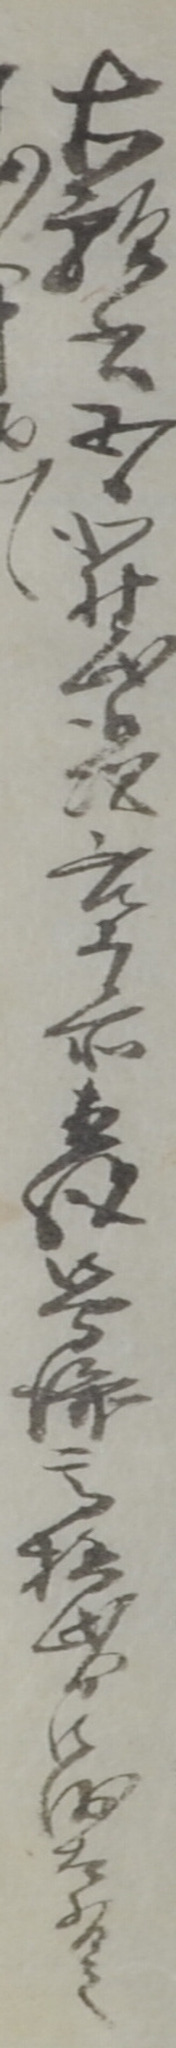右願書五日北野氏御取次差上候所直様御聞済高橋氏ゟ御沙汰有之

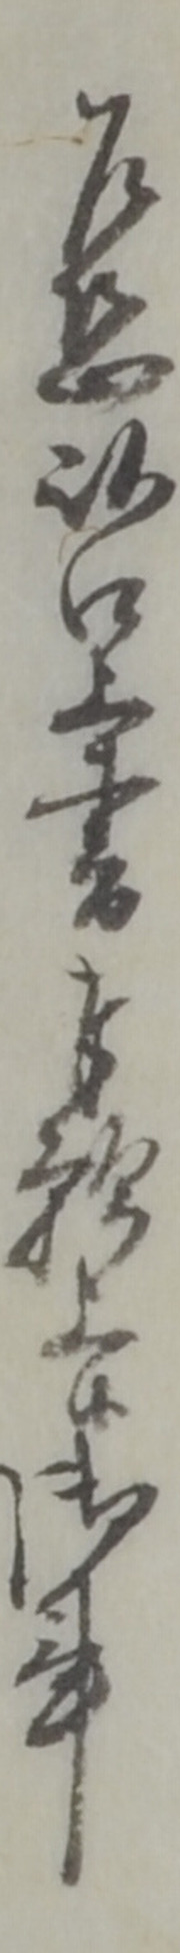乍恐以口上書奉願上候御事
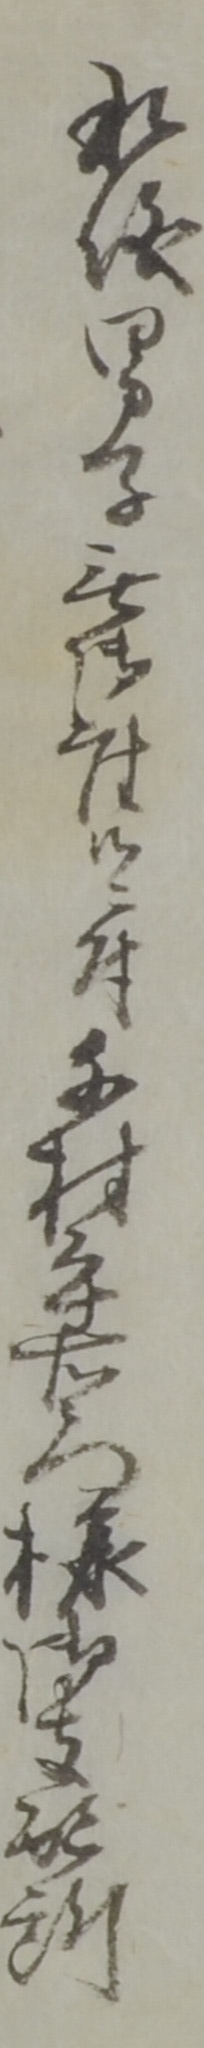私儀男子無御座候ニ付千村平右衛門様御支配所
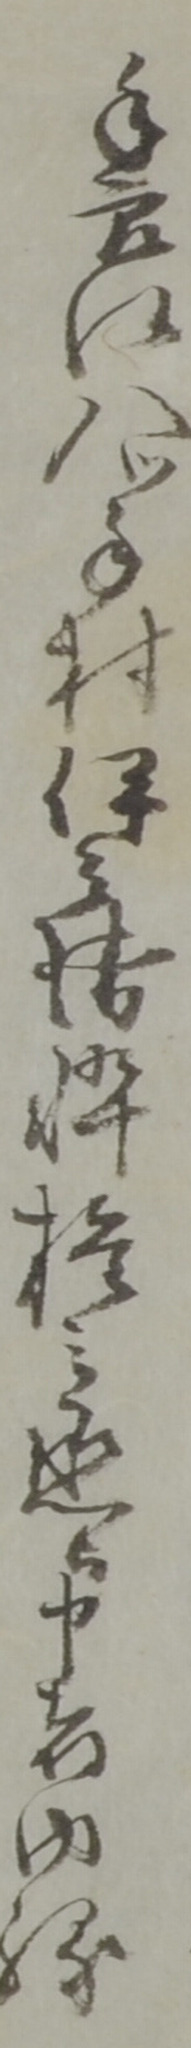手良郷八ッ手村伊兵衛忰権之丞与申者内縁
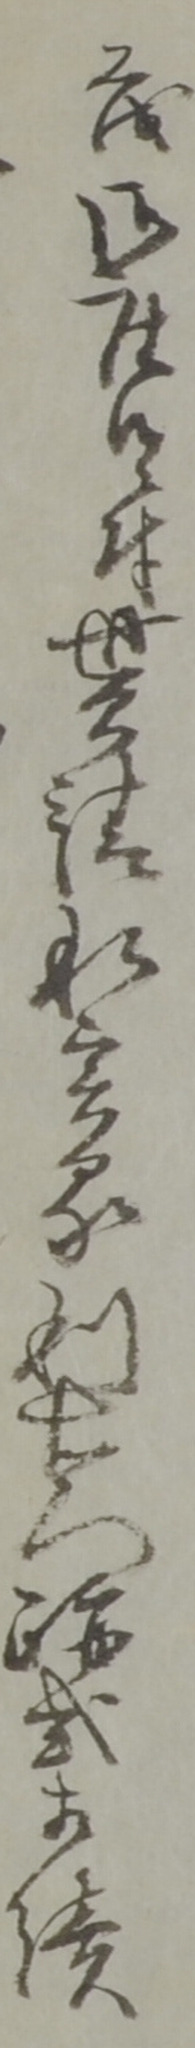も御座候ニ付貰請私実家利右衛門跡式相続
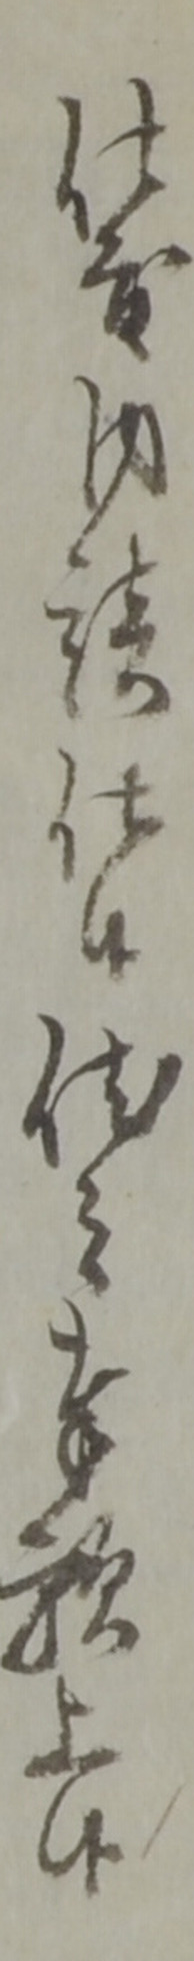仕度内談仕候依之奉願上候
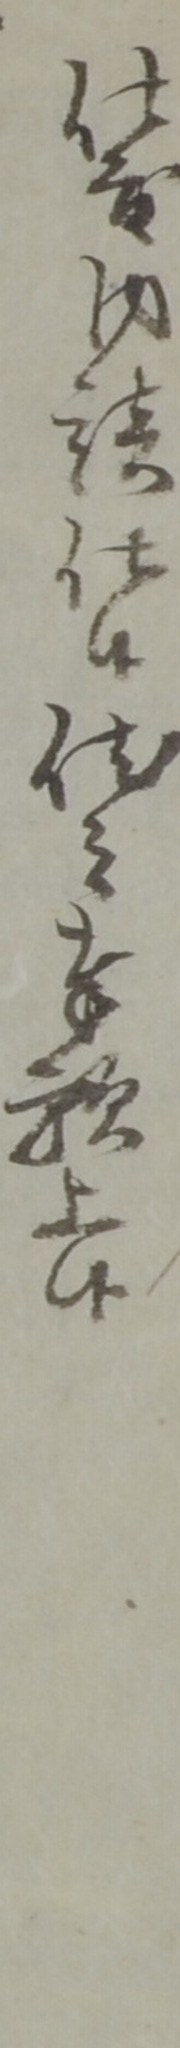仕度内談仕候依之奉願上候
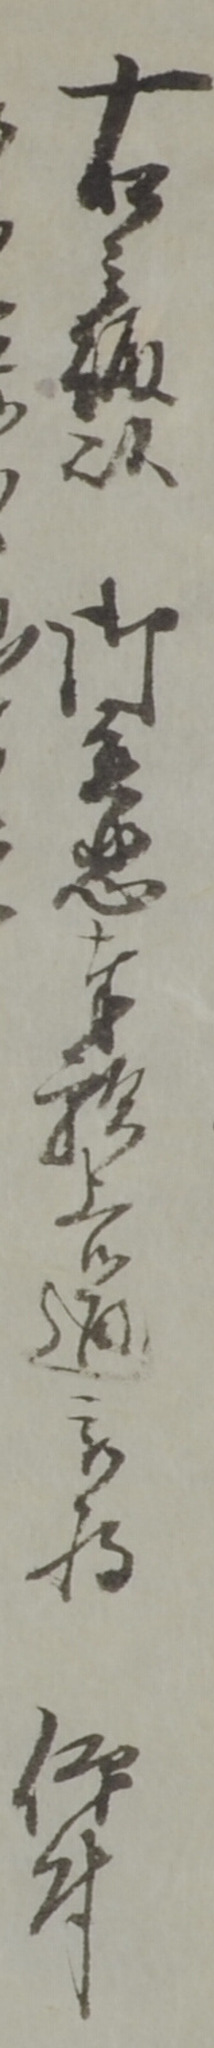右之趣以御慈悲奉願上候通被為仰付
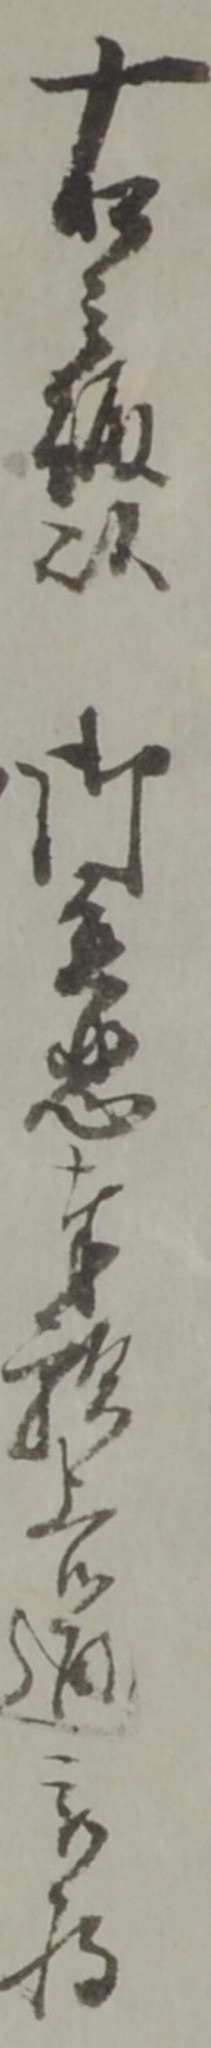右之趣以御慈悲奉願上候通被為仰付
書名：諸願書控簿
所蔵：伊那市立高遠町図書館・合同会社AMANE
